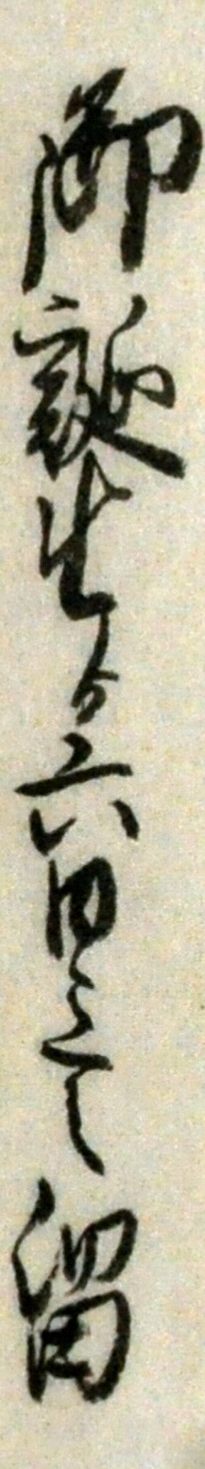御誕生ゟ六日迄之留
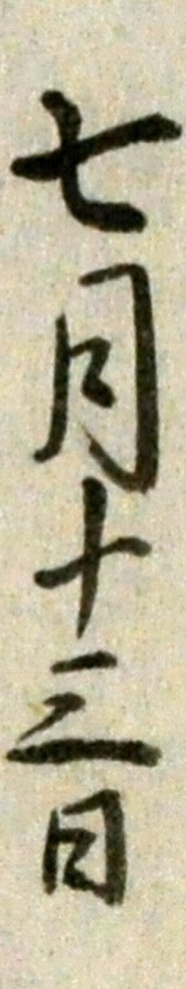七月十三日
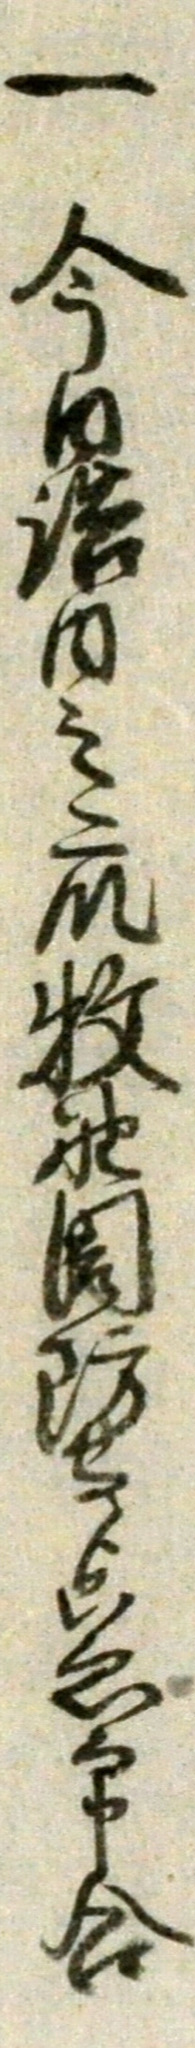一今日詰日之衆牧野周防守ゟ兼而申合
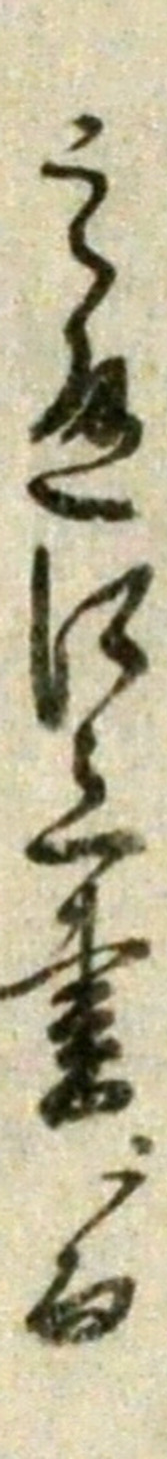之通口上書ニ而
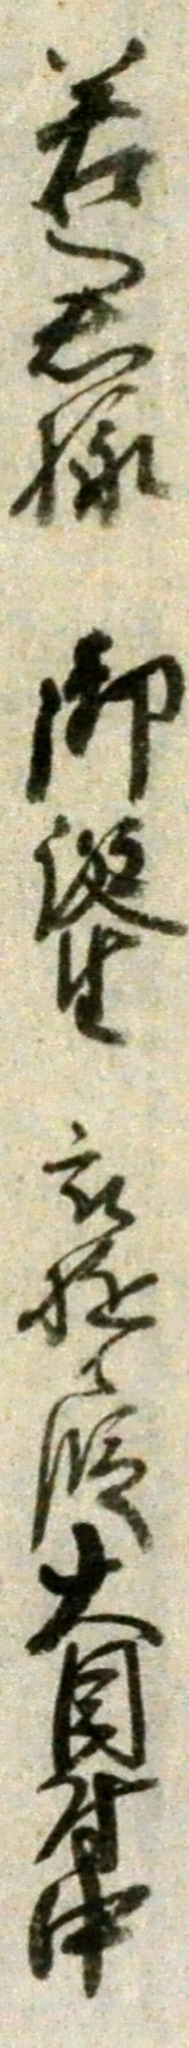若君様御誕生被遊候段大目付中
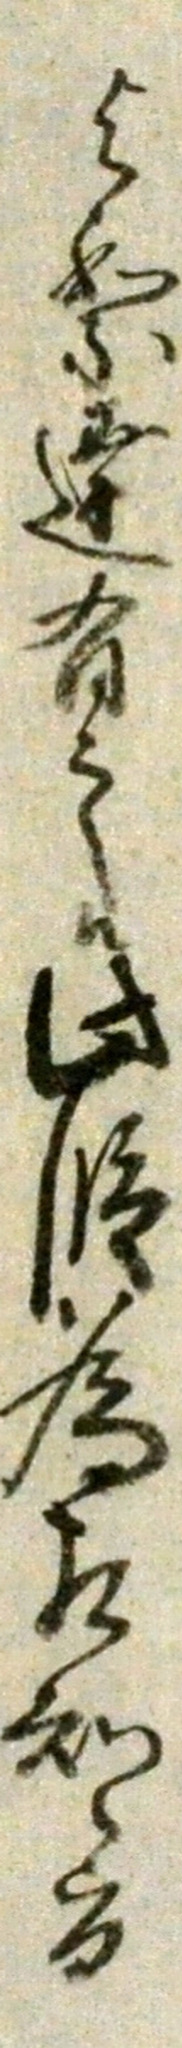より達有之候此段為相知候旨
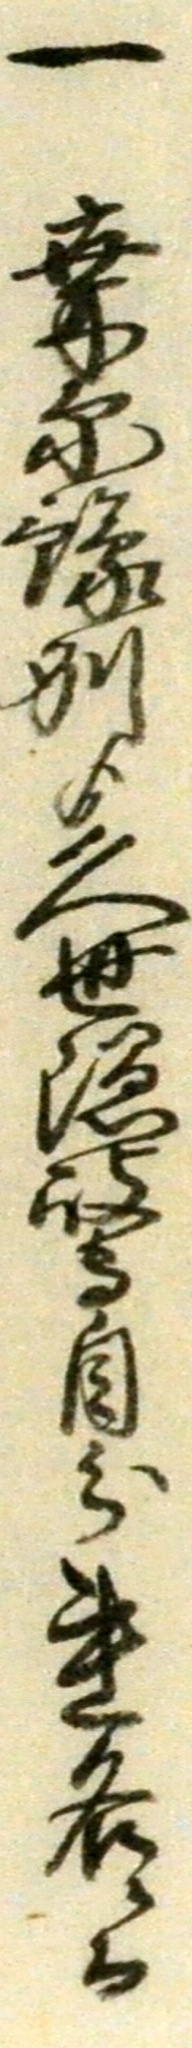一桑原豫州ゟ久世隠岐守自分連名ニ而
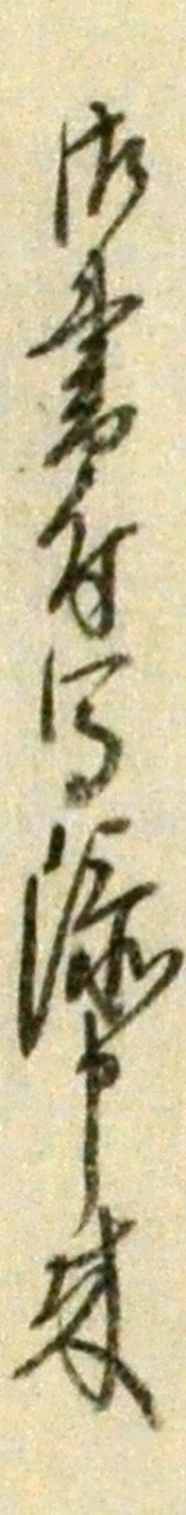御書付写添申来
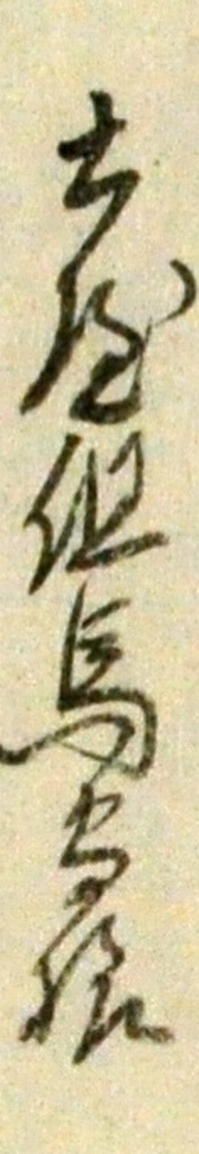土屋但馬守様
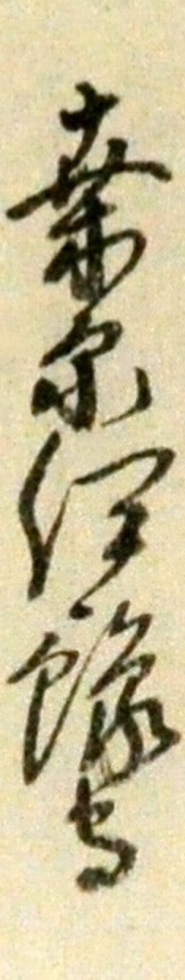桑原伊豫守
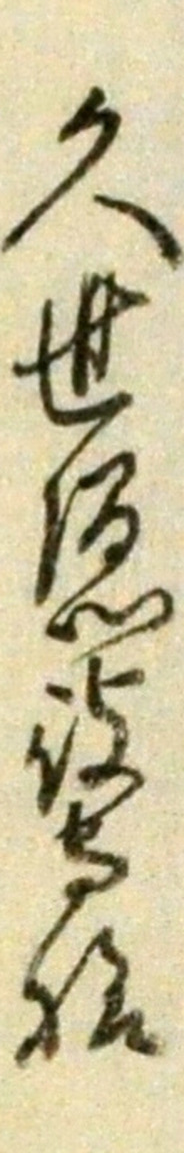久世隠岐守様
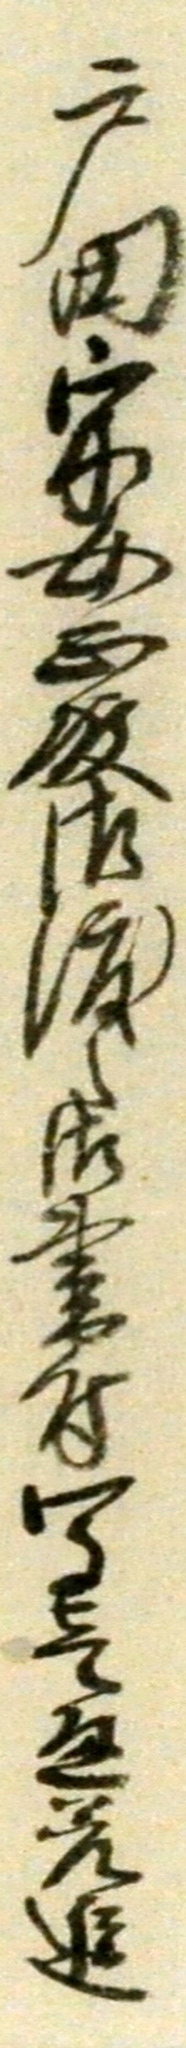戸田采女正殿御渡之御書付写壱通差進
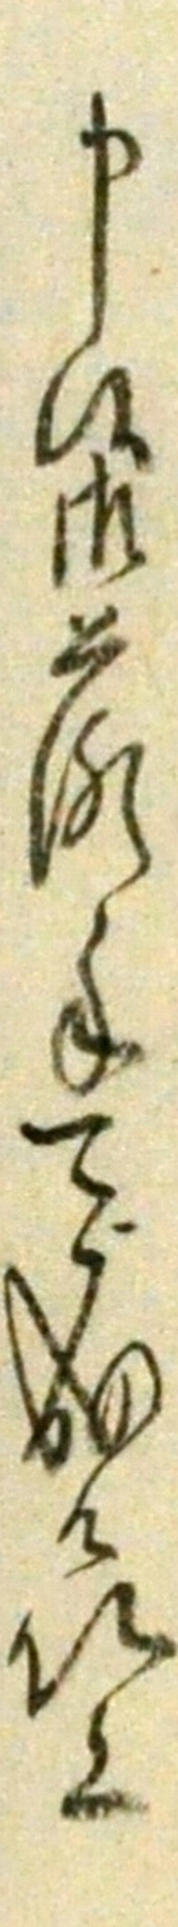申候御落手可被成候以上
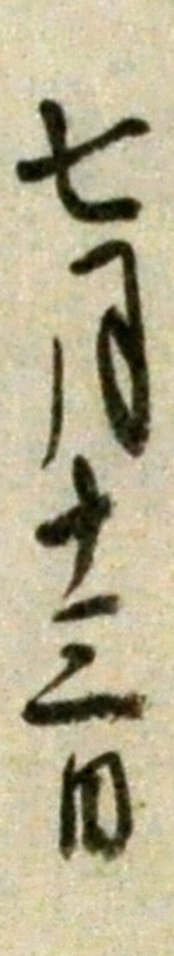七月十三日
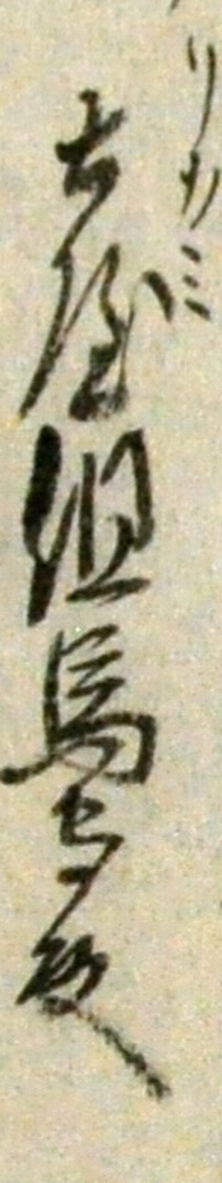土屋但馬守様
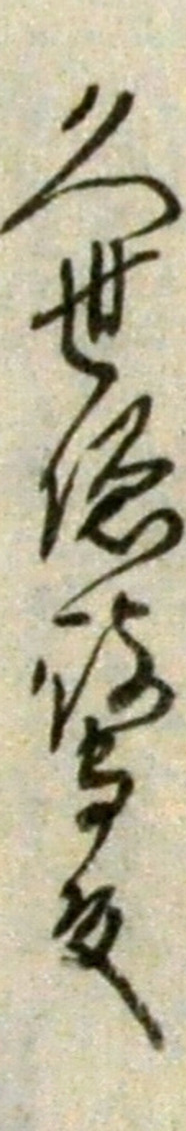久世隠岐守様
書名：若君様（家斉嫡男）誕生諸祝儀ノ節ノ留書外
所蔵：伊那市立高遠町図書館・合同会社AMANE
